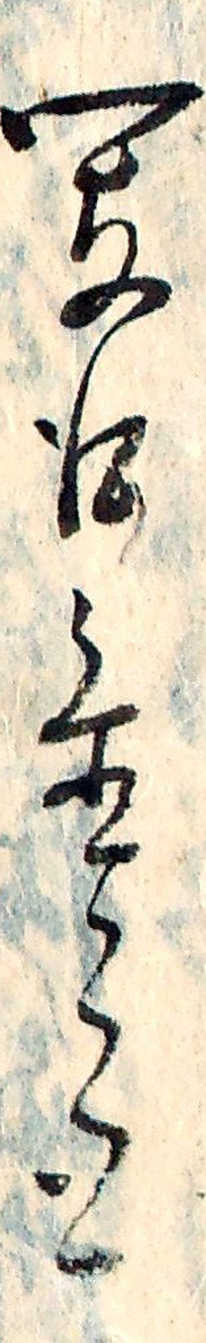写取置候以上
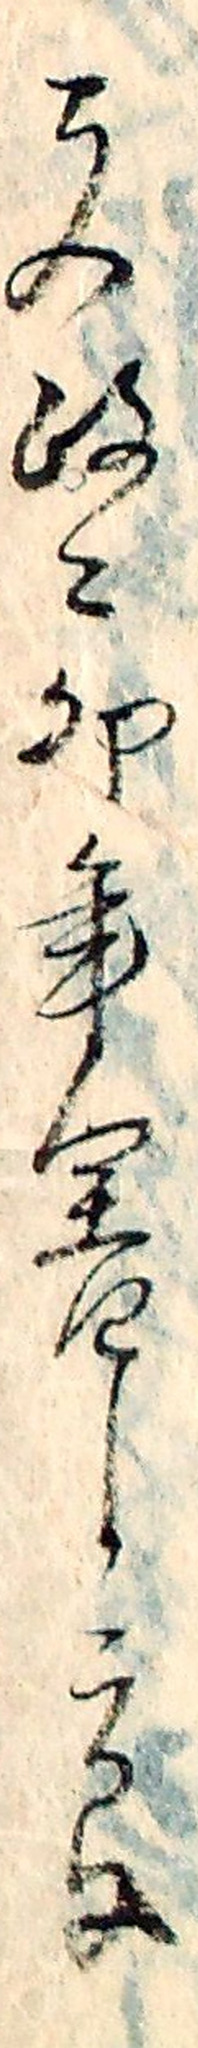文政二卯年閏四月二日
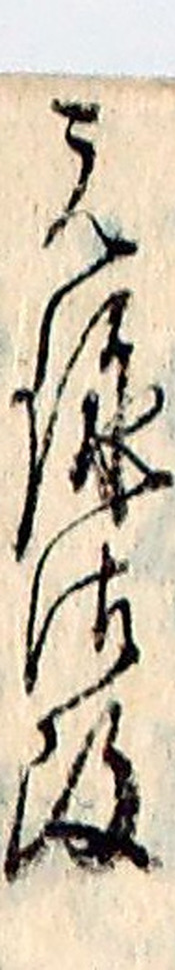元禄御改
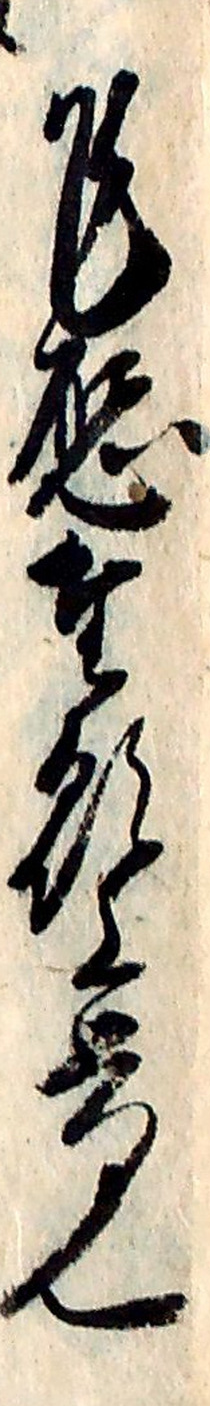乍恐奉願上覚
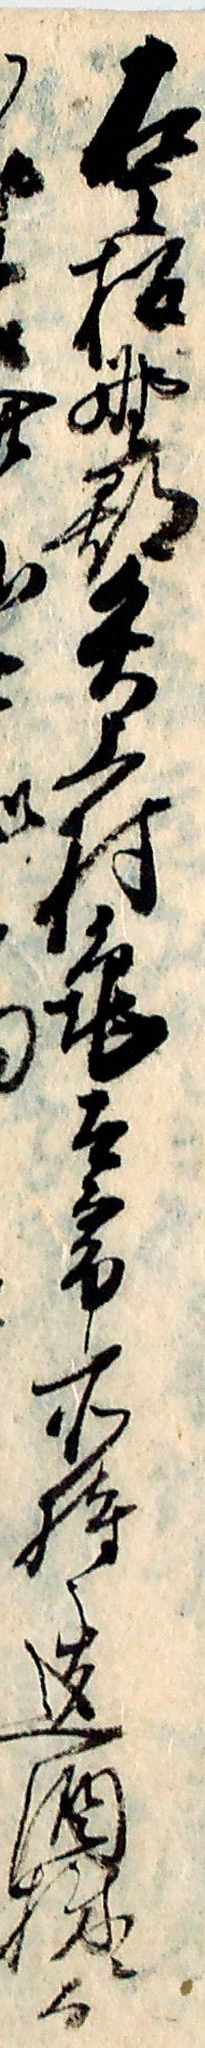右は板野郡矢上村亀太郎所持之造酒株にて
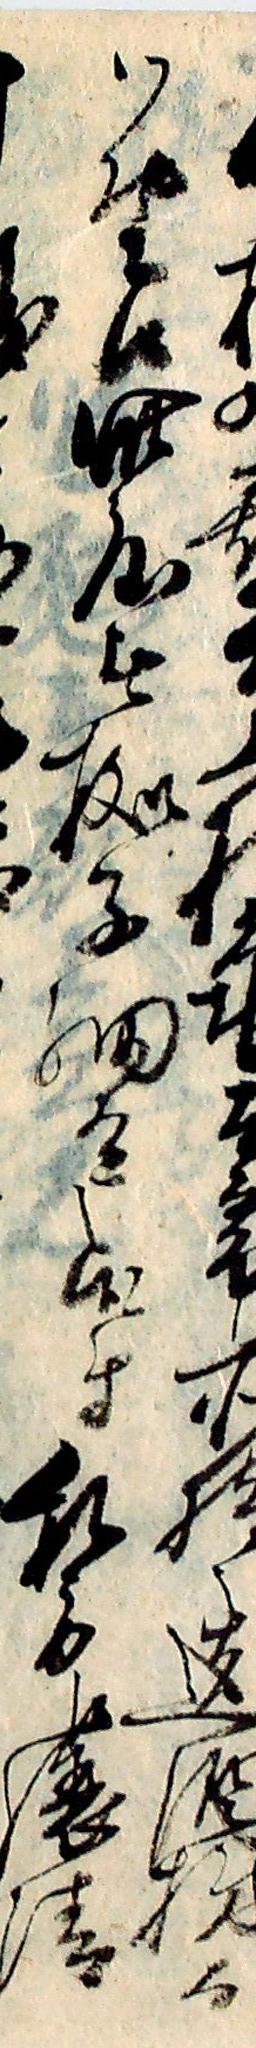御座候此度無拠子細有之候に付私方え譲請
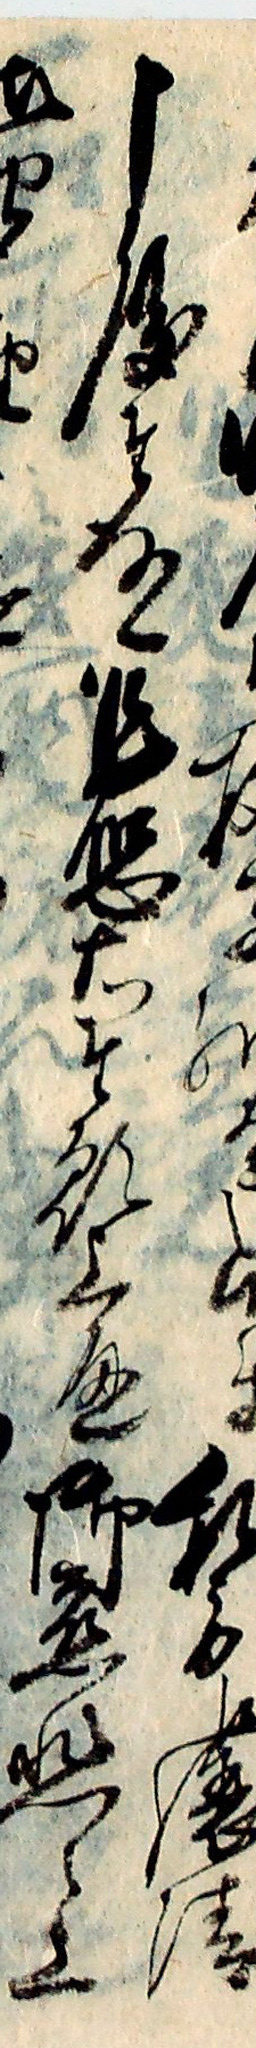申度奉存候乍恐右奉願上通御慈悲之上
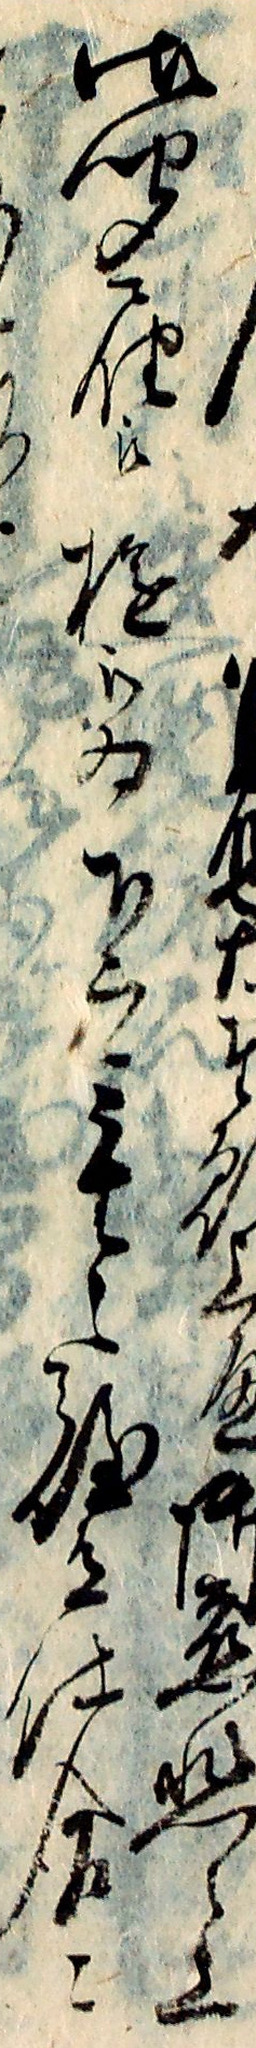御聞届被遊被為下候はゝ重々難有仕合に
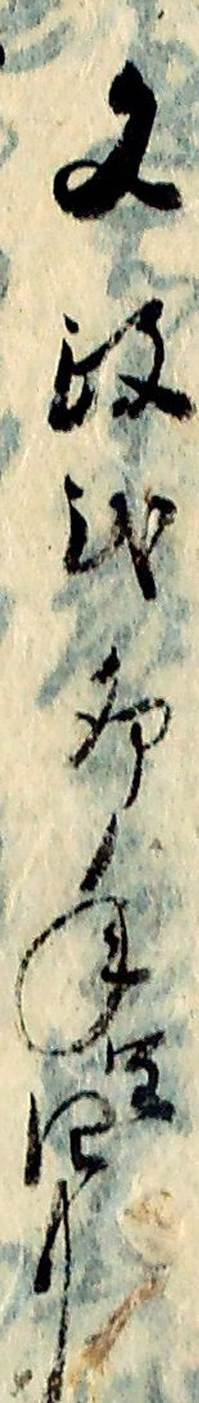文政弐卯年閏四月
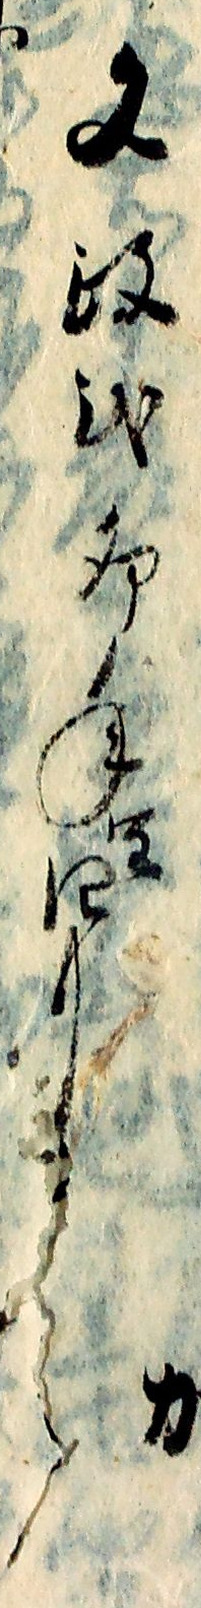文政弐卯年閏四月
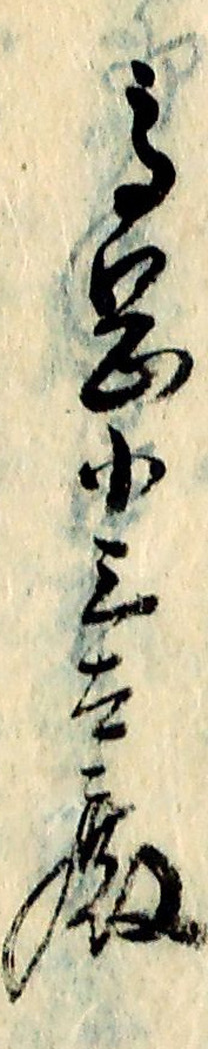高岡小三太殿
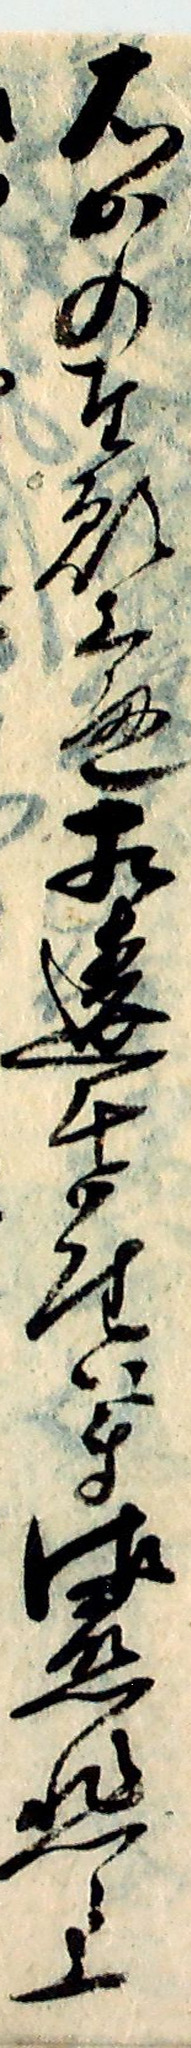右かの奉願上通相違無御座候付御慈悲之上
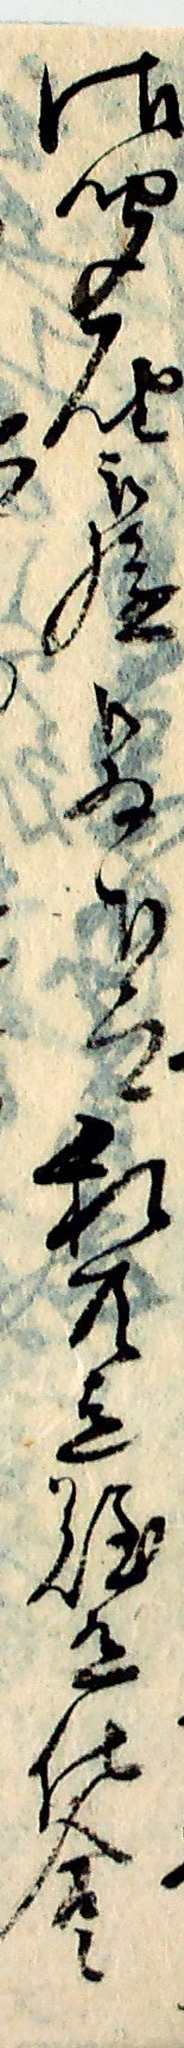御聞届被遊被為下候はゝ私共迄難有仕合に
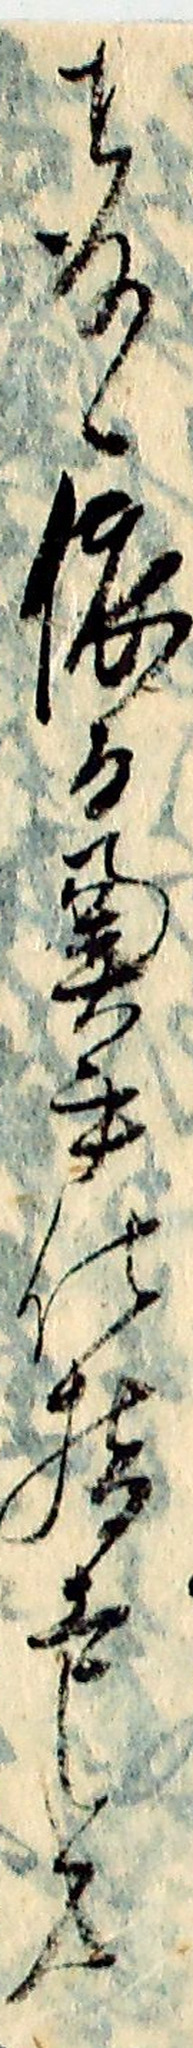奉存候依て奥書仕指上申候以上
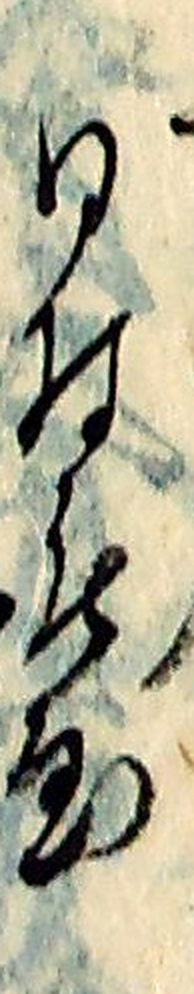同村庄屋
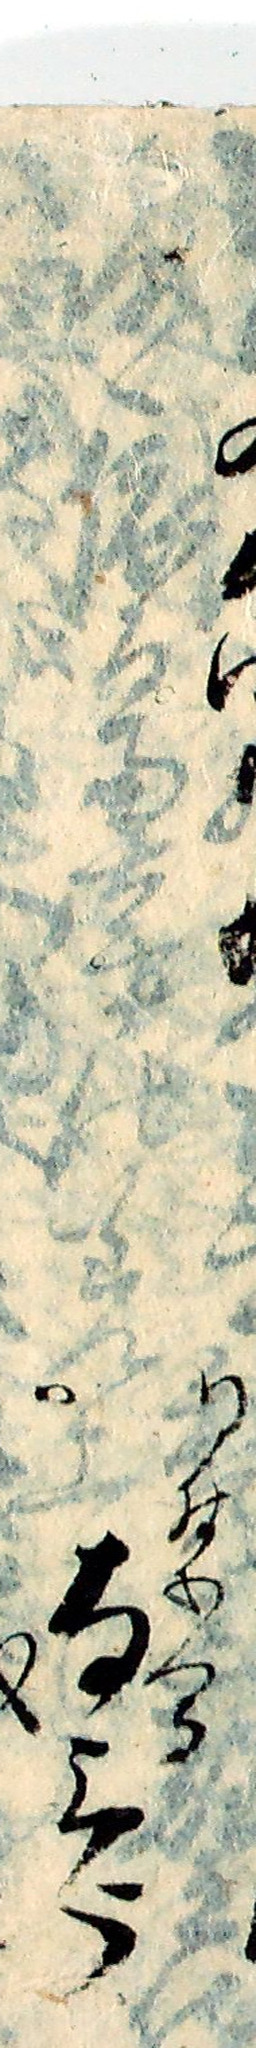与三郎
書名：諸御願書控(後藤氏壱番）
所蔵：鳴門教育大学 Naruto University of Education
